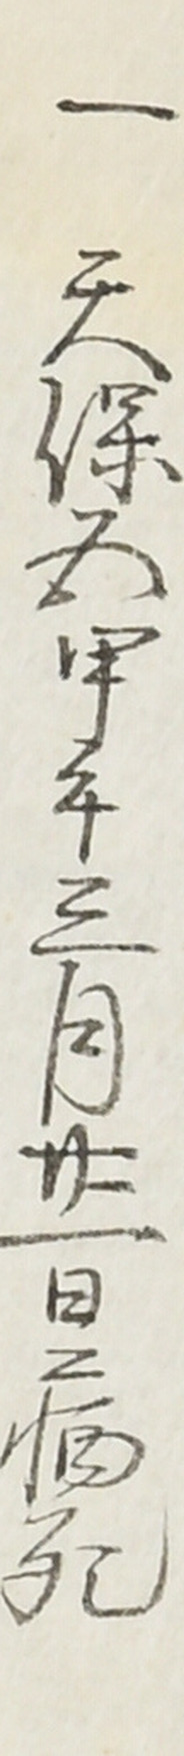一天保五甲午三月廿一日病死
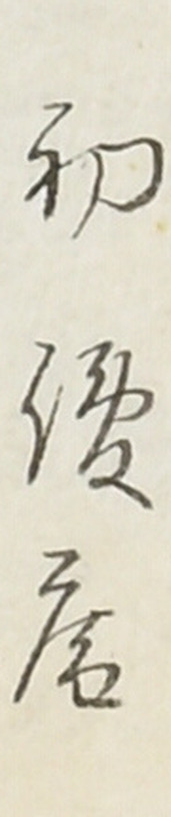初俊庵
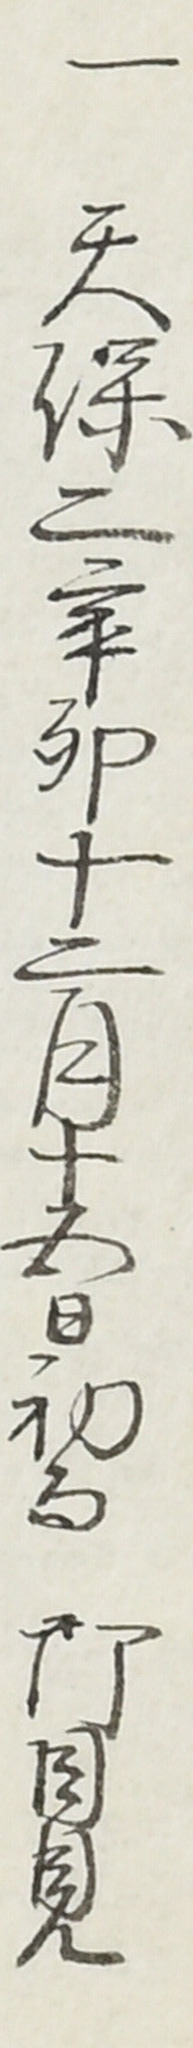一天保二辛十二月十五日初而御目見
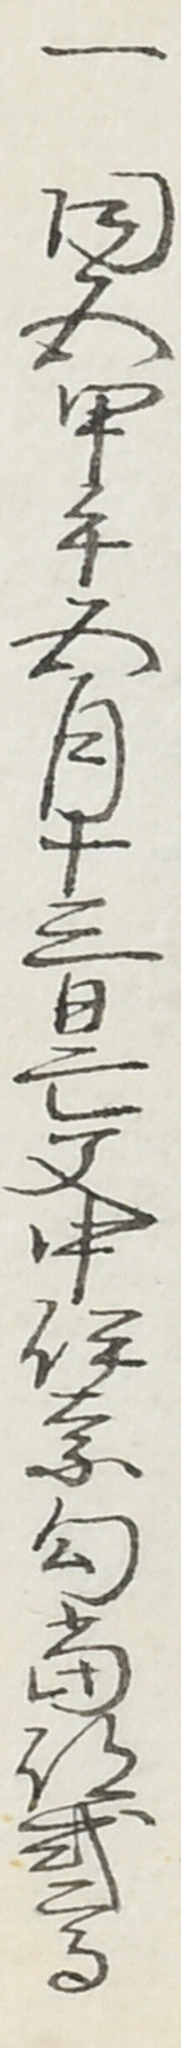一同五甲午五月十三日亡父中伊奈勾当跡式高
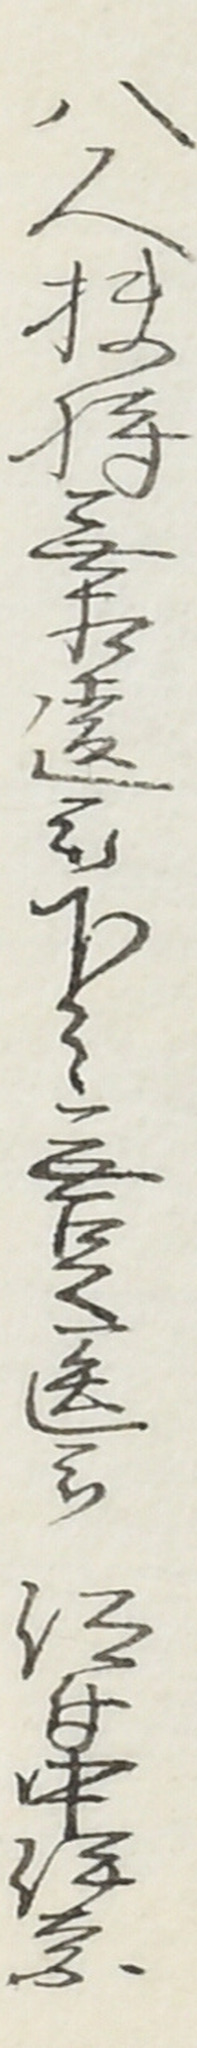八人扶持無相違被下之無足医被仰付中伊奈

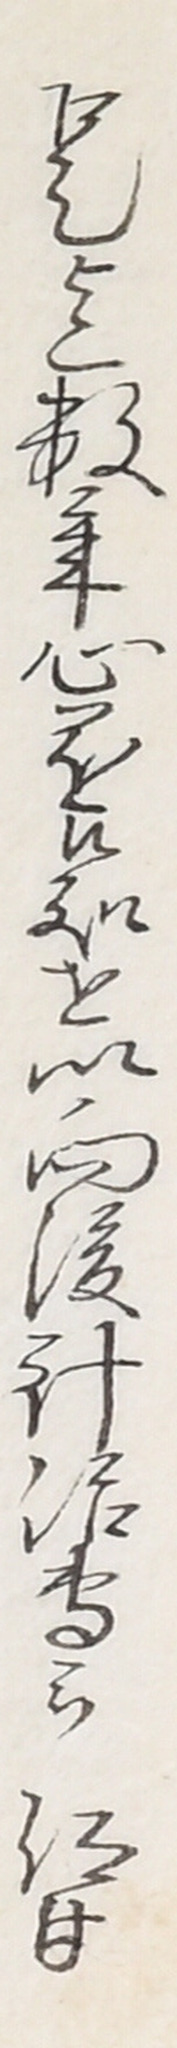是迄数年心懸候処を以向後針治専被仰付
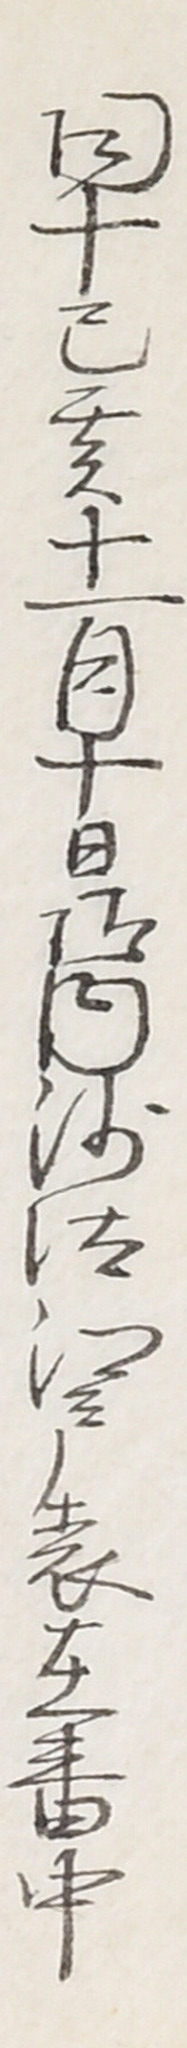一同十己亥十一月十日御内沙汰江戸表在番中
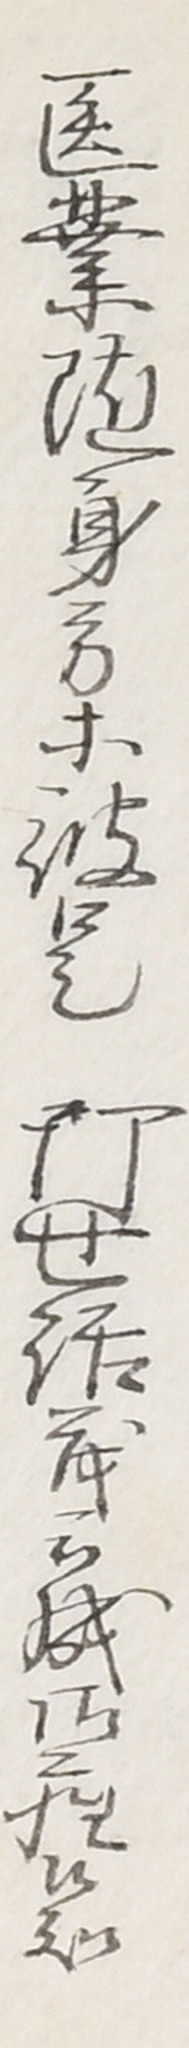医業随身方等彼是御世話茂被成御座候処
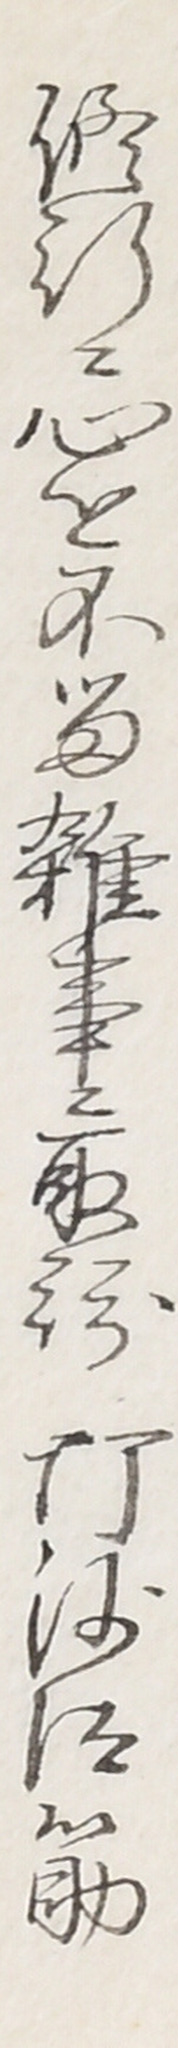修行ニ心を不留雑事ニ取紛御沙汰筋
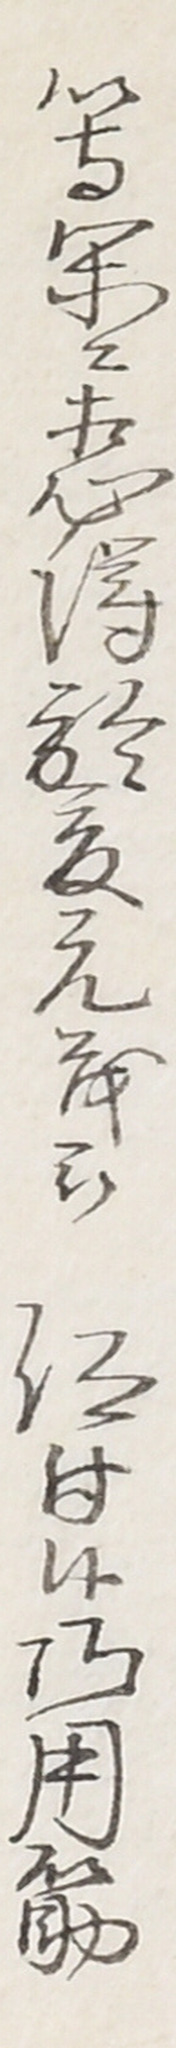等閑ニ相心得於爰元茂被仰付候御用筋
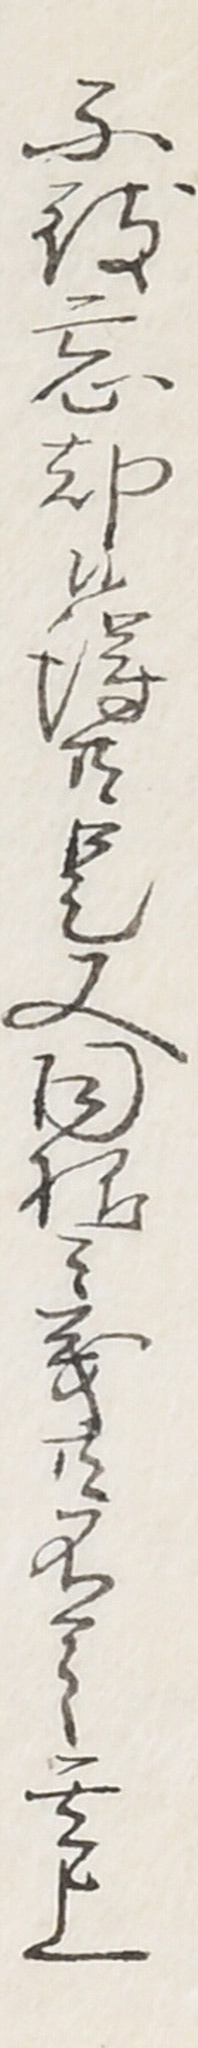不致忘却候得共是又同様之義共有之其上
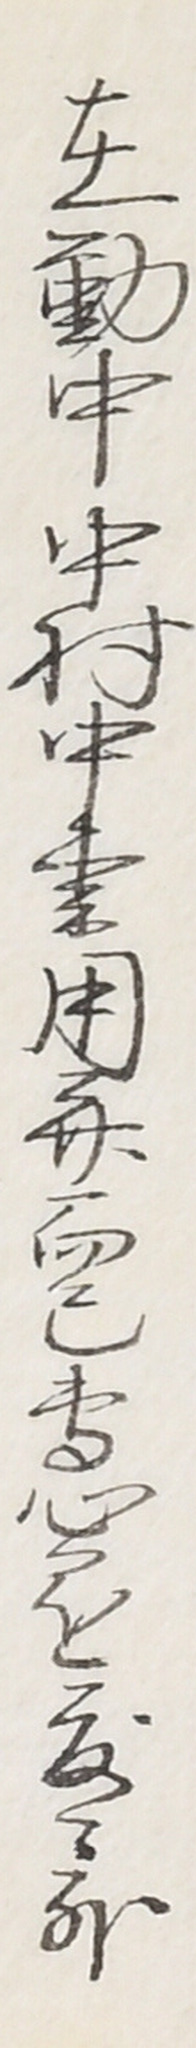在勤中中村中書用弁而已専心懸度々外
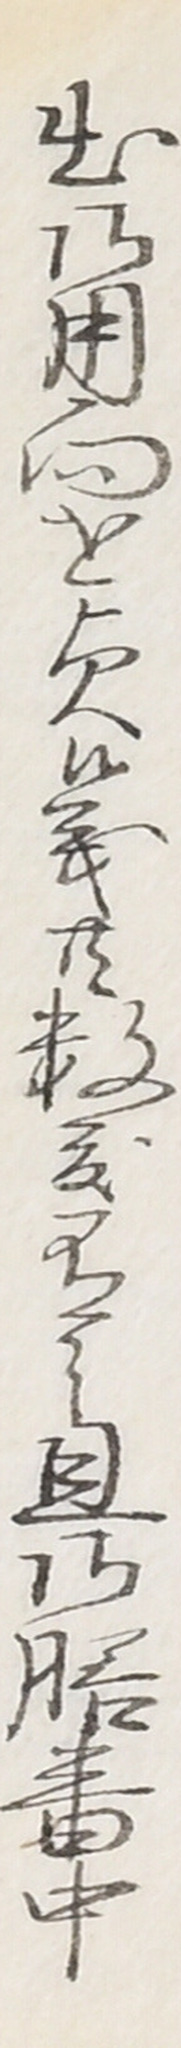出御用向を候義共数度有之且御膳番中
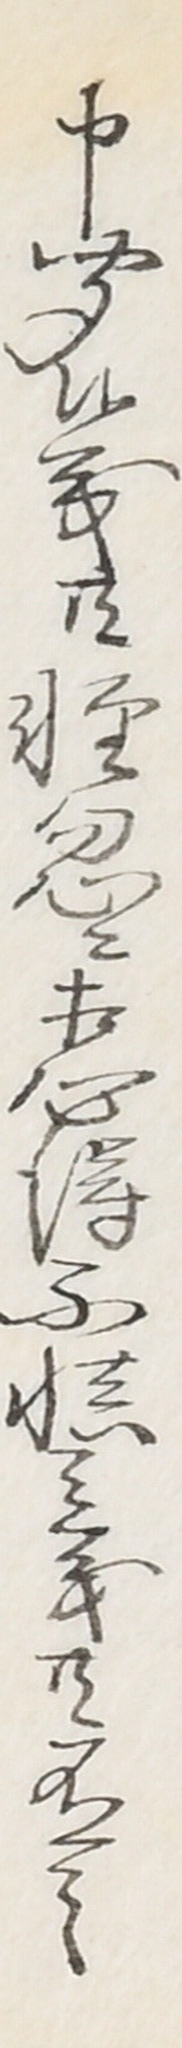中聞候義共軽忽ニ相心得不慎之義共有之
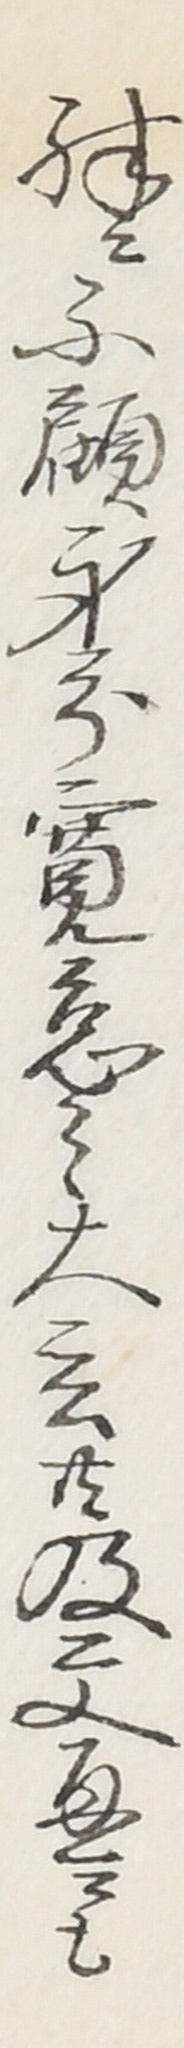殊ニ不顧身分寛怠之大言共及交通ニも
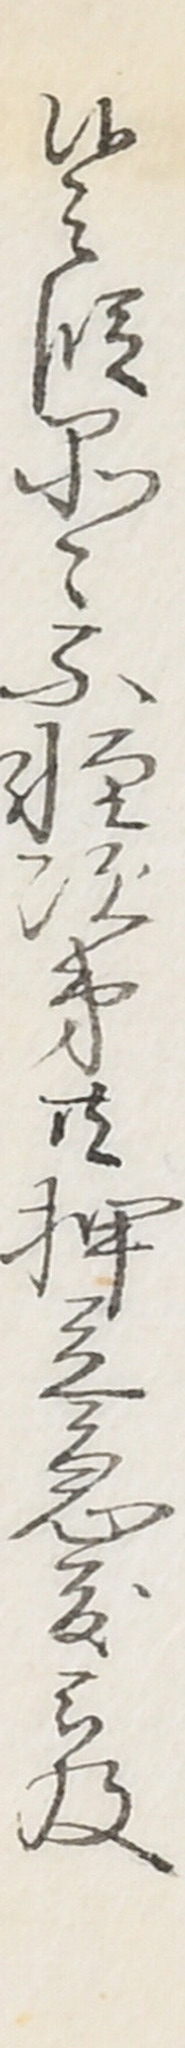候之段品々不軽次第共押立急度被及
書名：給人諸士勤仕録（七）
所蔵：伊那市立高遠町図書館・合同会社AMANE
